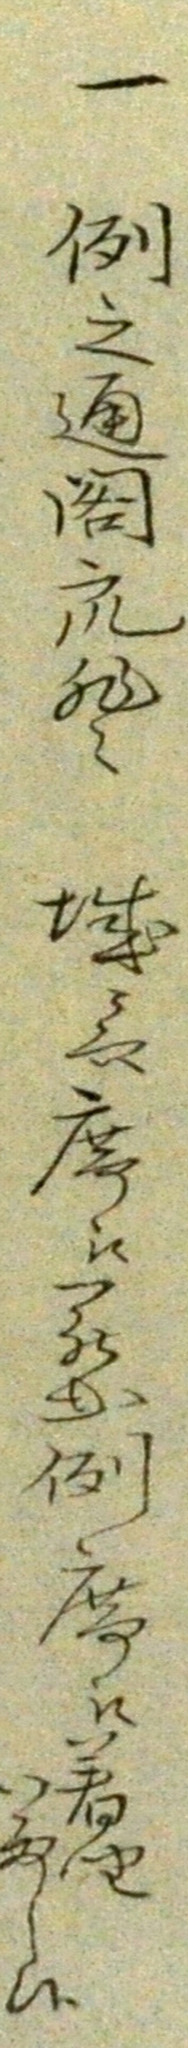一例之通閣衆登城ニ而席え罷出例席え着坐いたし候
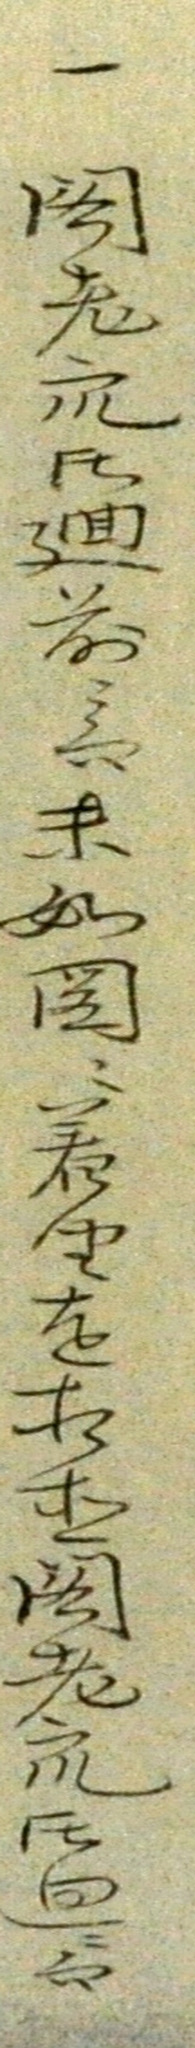一閣老衆御廻前ニ而末如図ニ着坐を相直閣老衆御廻ニ而
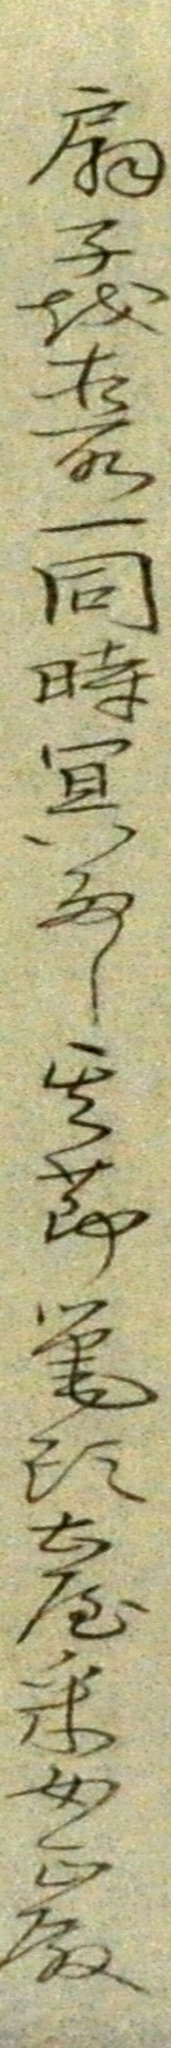扇子を相取一同時宜いたし其節筆頭土屋采女正殿
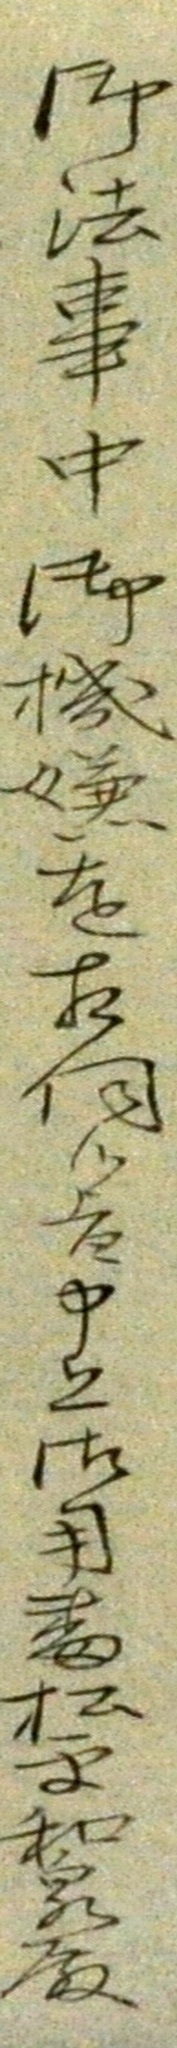御法事中御機嫌を相伺候旨申上御用番松平和泉殿
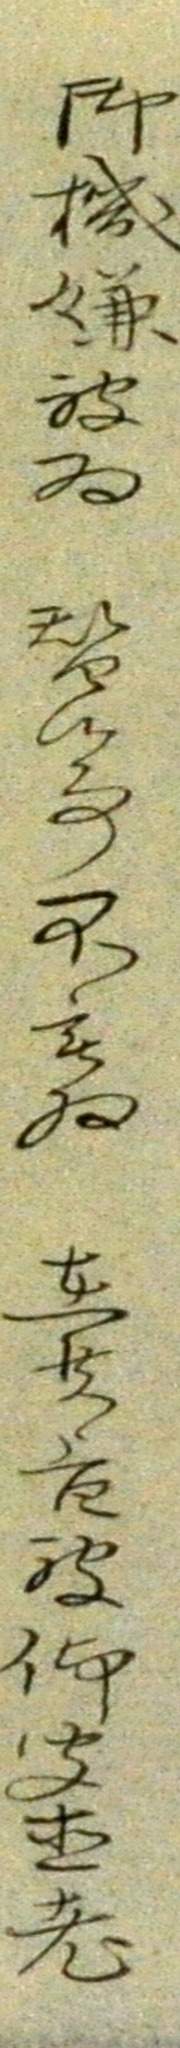御機嫌被為替候事不被為在候旨被仰聞直老
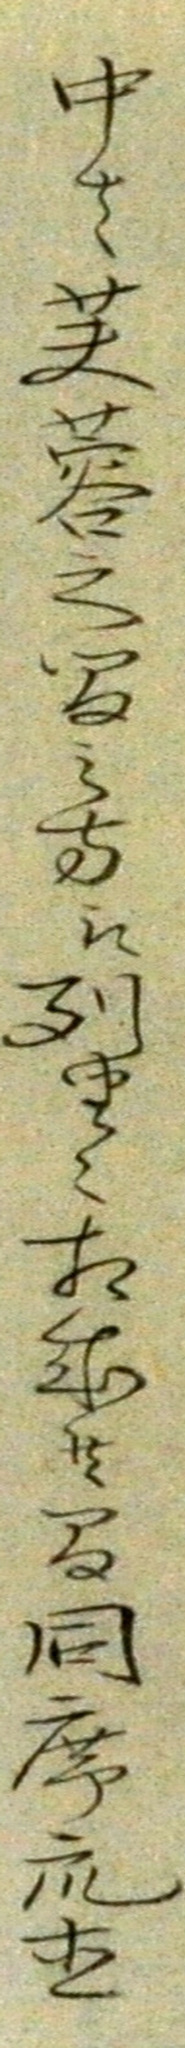中は芙蓉之間之方え列坐ニ相成候間同席衆直
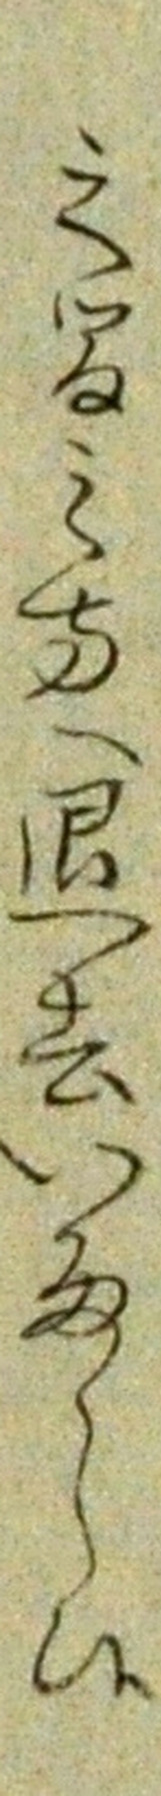之間之方へ退去いたし候

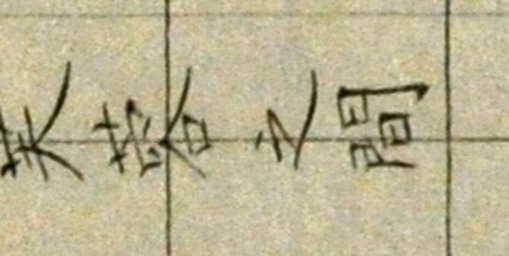芙蓉之間
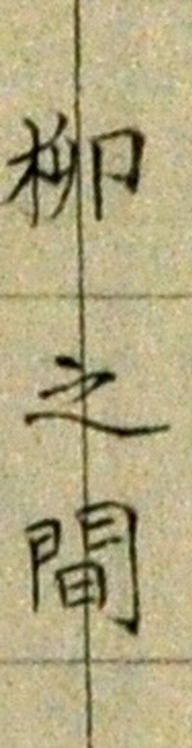雁之間
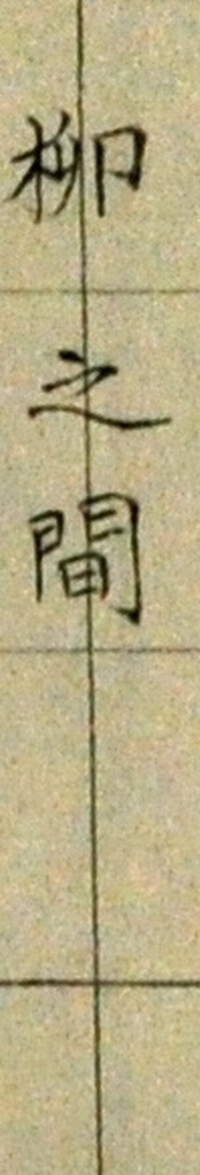雁之間
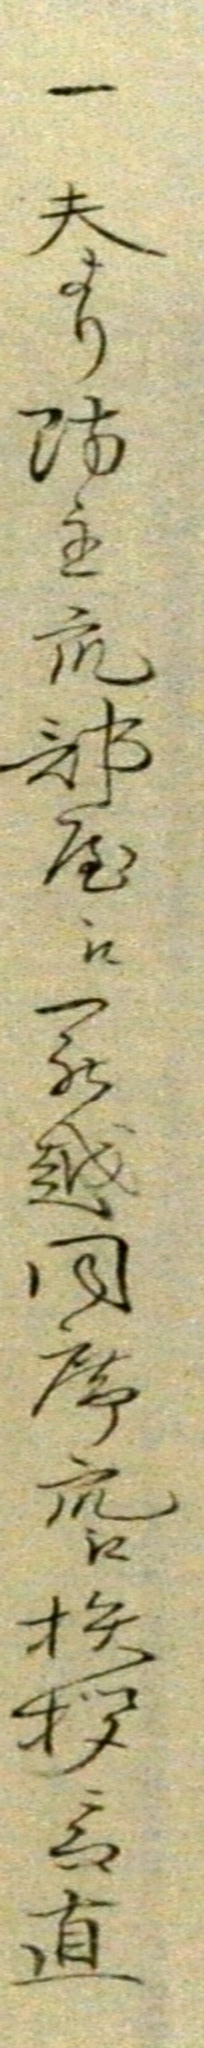一夫より坊主衆部屋え罷越同席衆え挨拶ニ而直
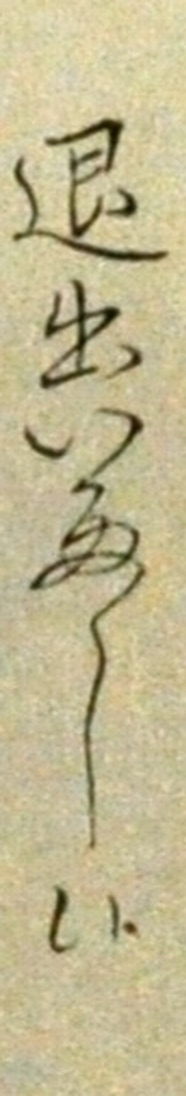退出いたし候

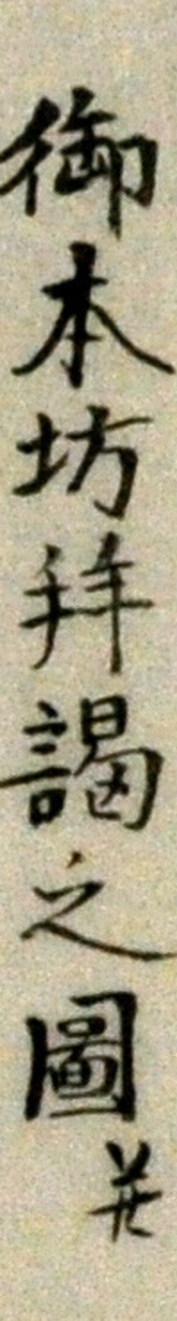御本坊拝謁之図并
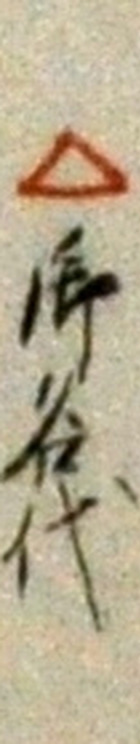御名代
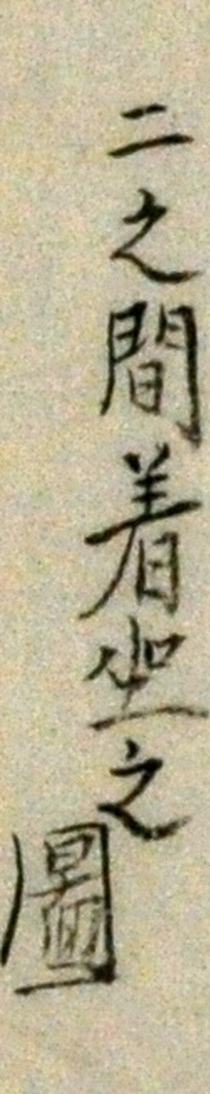二之間着坐之図
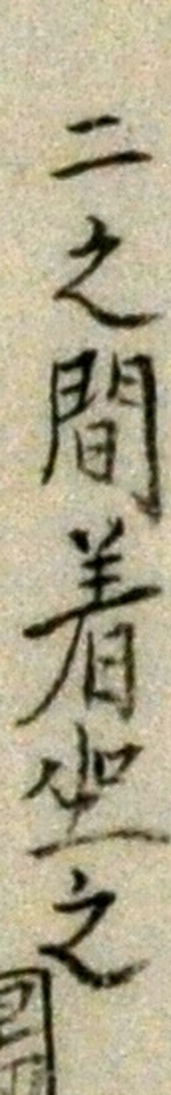二之間着坐之図
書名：諸留書〔一括〕
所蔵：伊那市立高遠町図書館・合同会社AMANE
